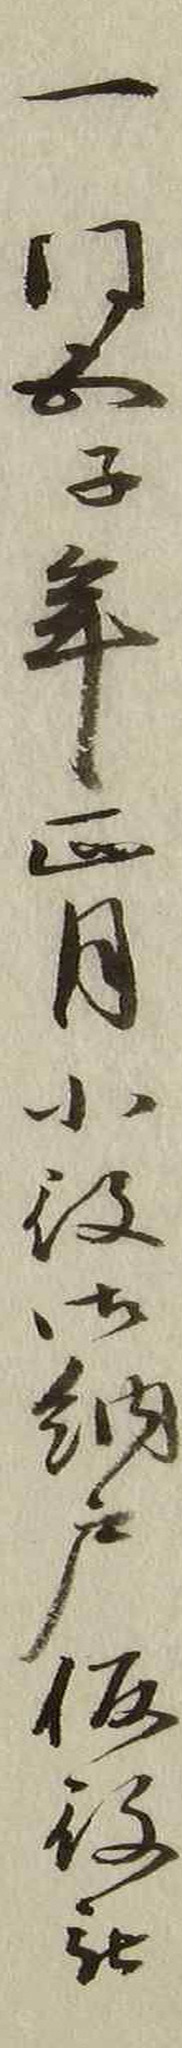一同五子年正月小役御納戸仮役被
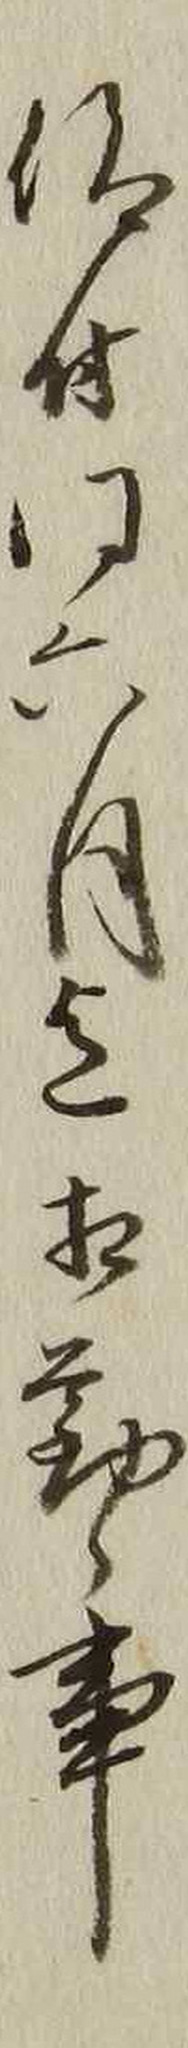仰付同六月迄相勤候事
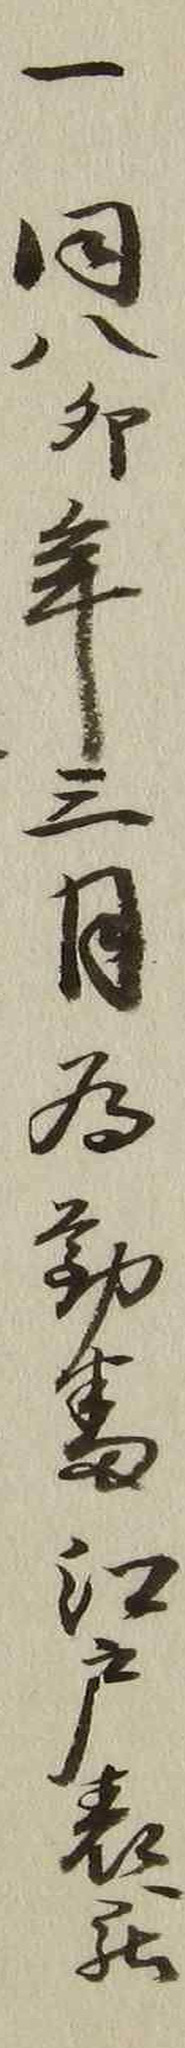一同八卯年三月為動番江戸表へ罷
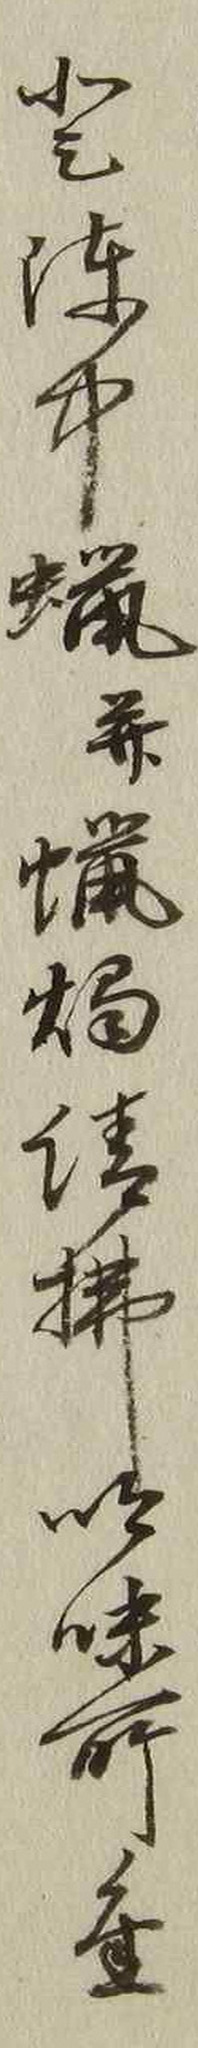登陣中蝋并蝋燭請払吟味所金
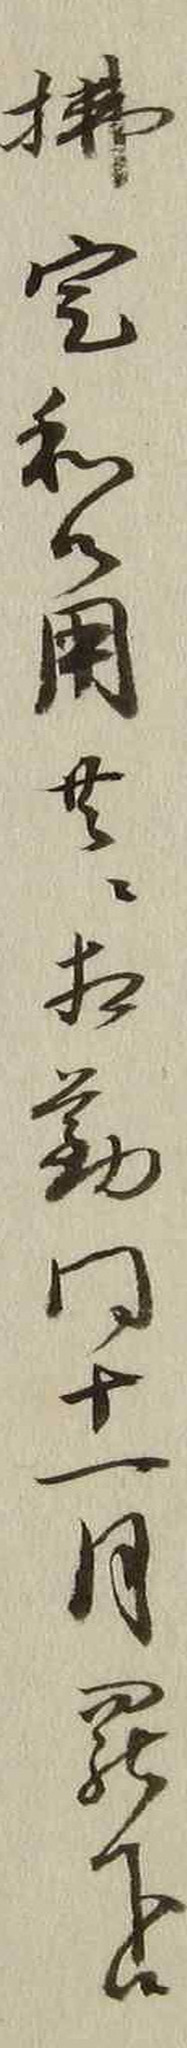払宅和御用共ニ相勤同十一月罷下候
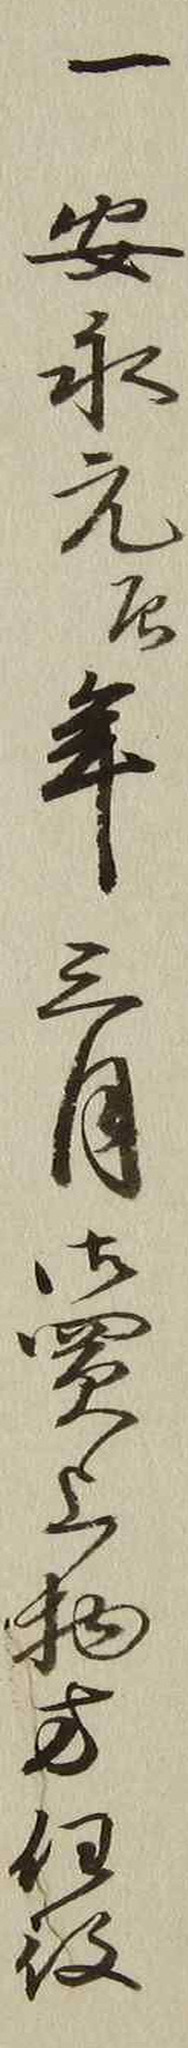一安永元辰年三月御買上物方任役
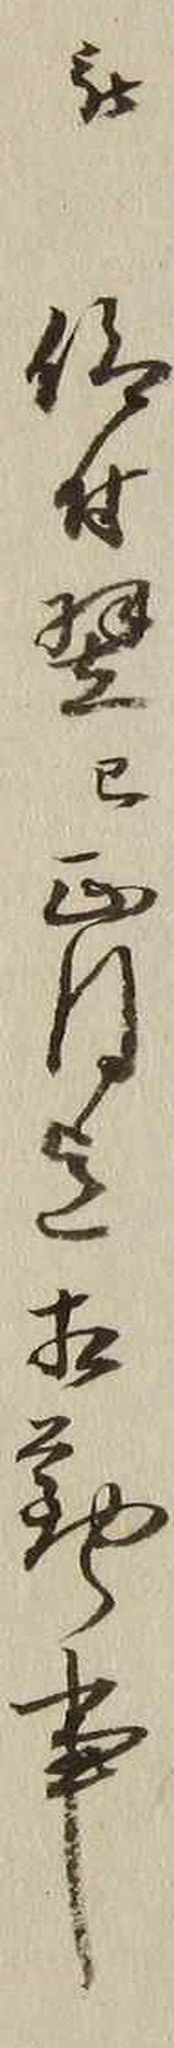被仰付翌巳正月迄相勤候事
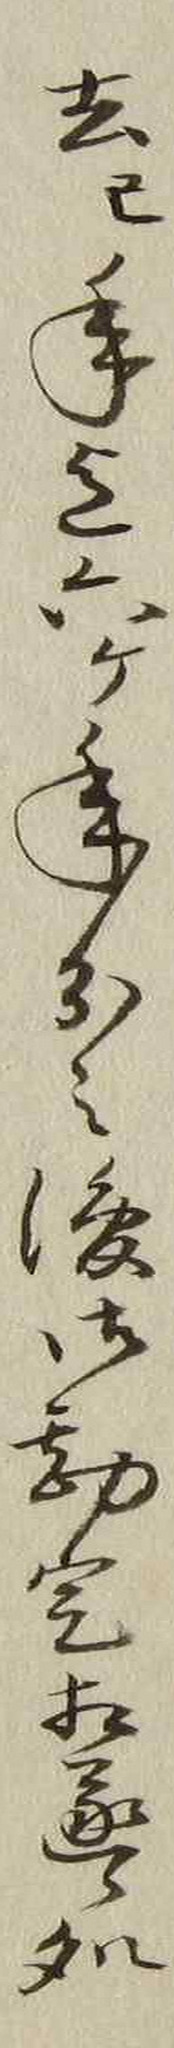去巳年迄六ケ年分之浚御勘定相遂候処
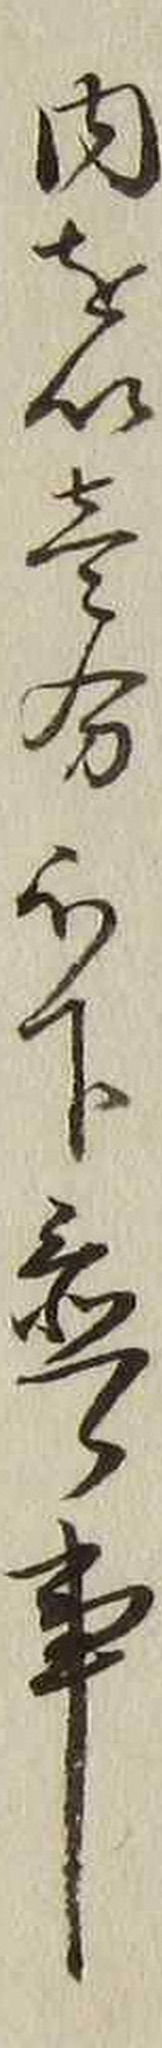内を以壱分被下置候事
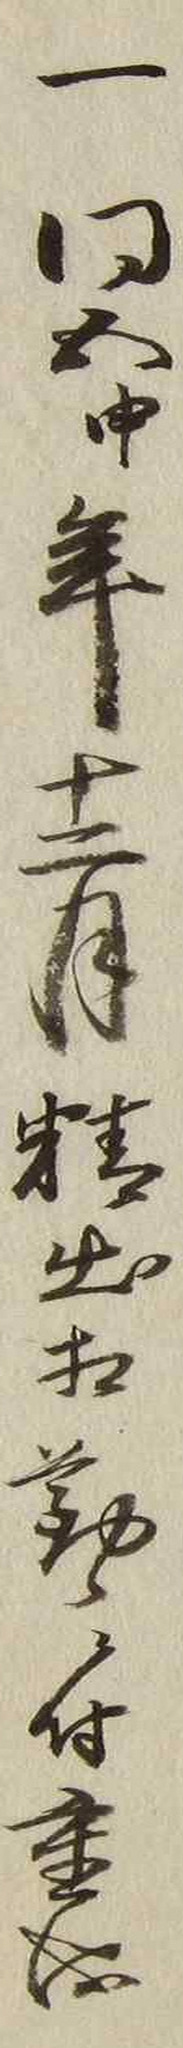一同五申年十二月精出相勤候ニ付重儀
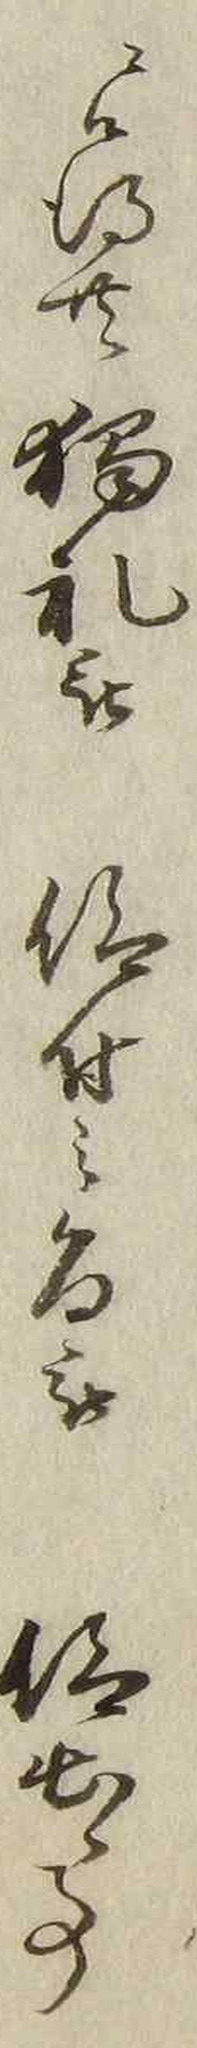ニ候得共独礼被仰付之旨被仰出候事
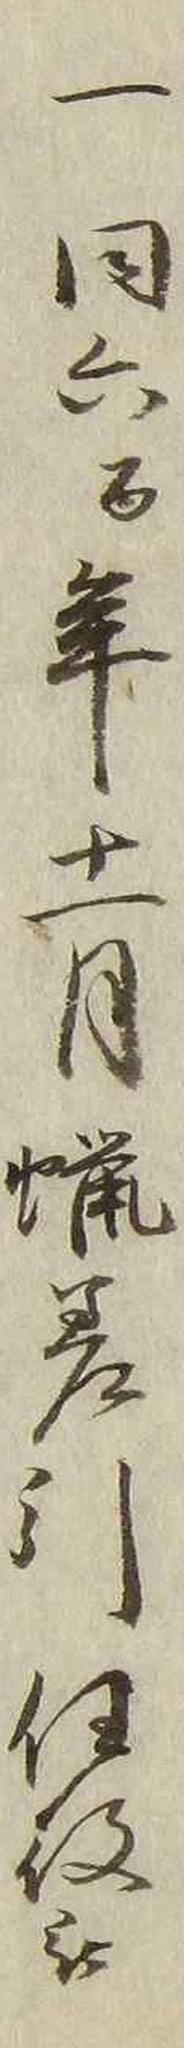一同六酉年十一月一蝋差引任役被
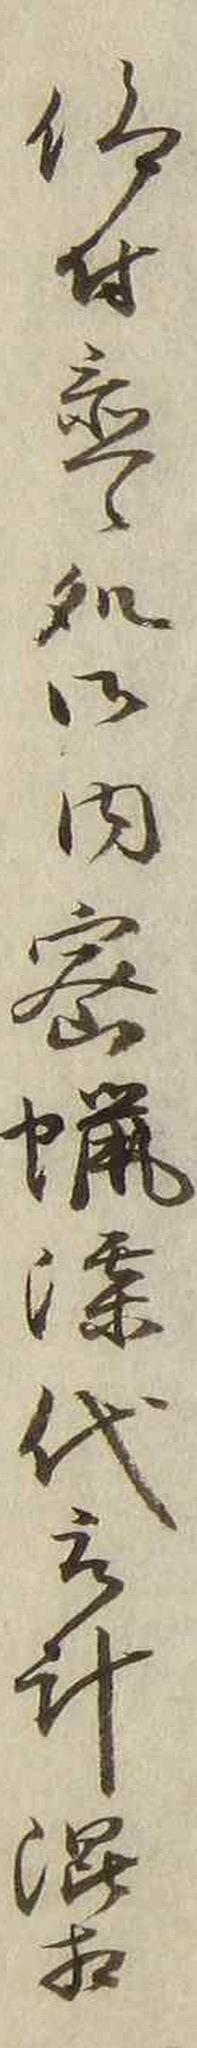仰付置候処御内密蝋漆代取計混相

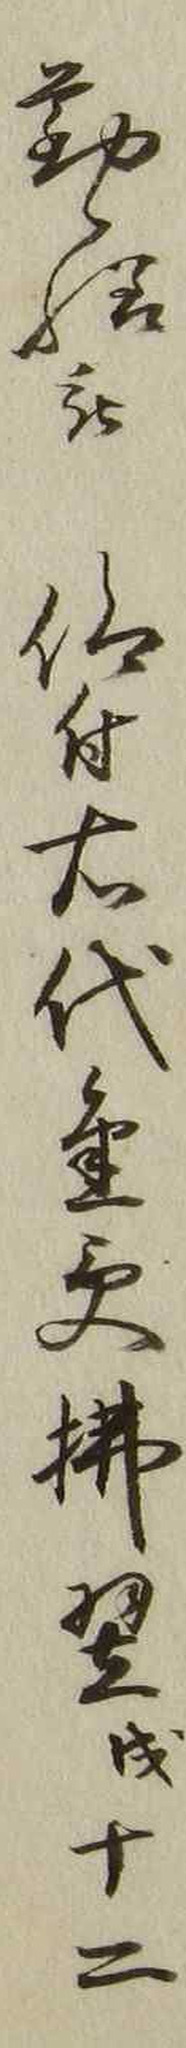勤候様被仰付右代金受払翌戌十二
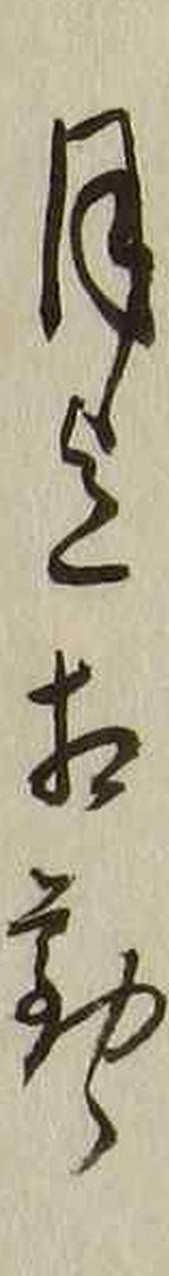月迄相勤候
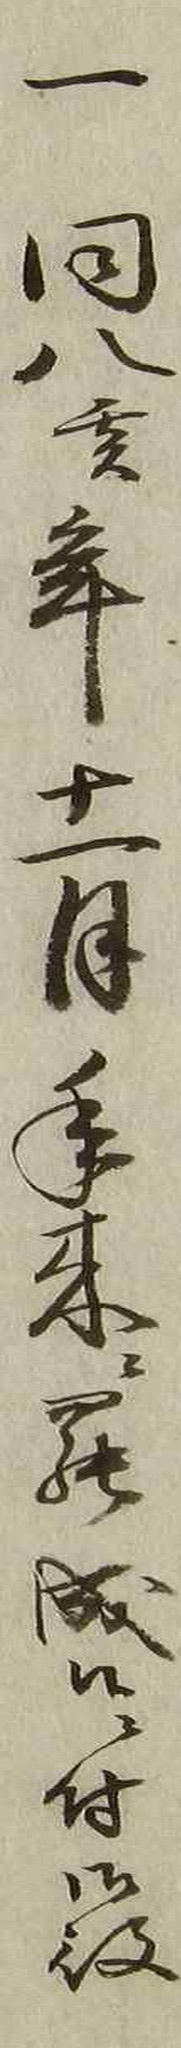一同八亥年十一月年来ニ罷成候ニ付御役
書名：諸士系譜　巻之102　か之部10
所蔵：会津若松市立会津図書館
